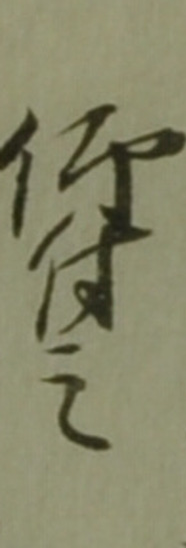仰付之
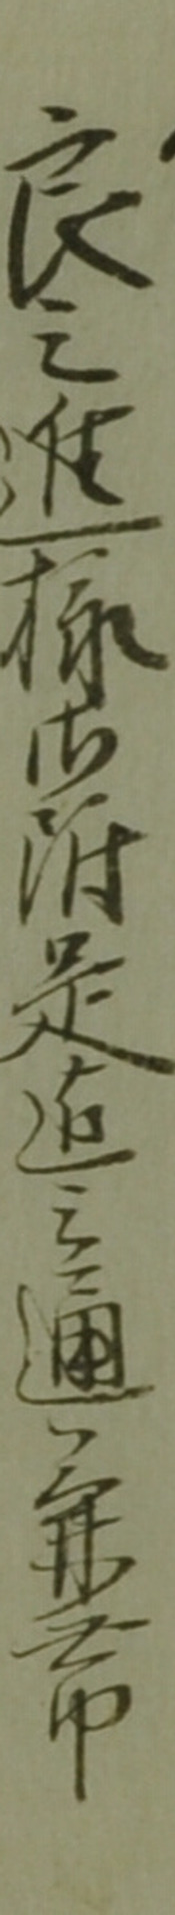良之進様御附是迄之通兼帯
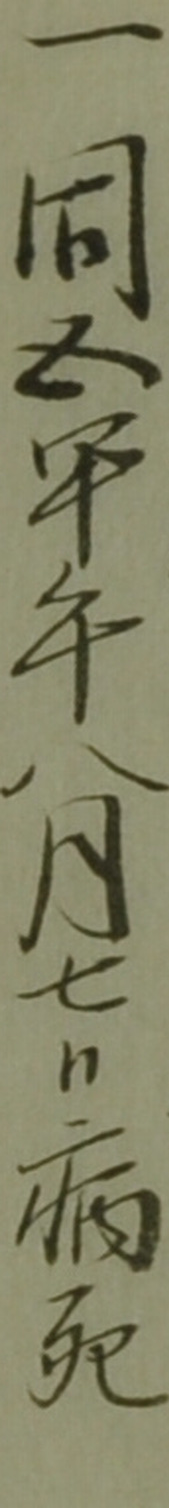一同五甲午八月七日病死
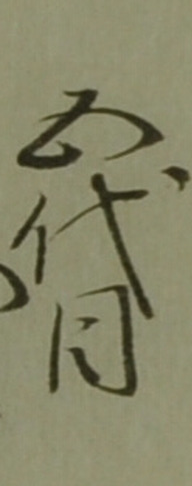五代目
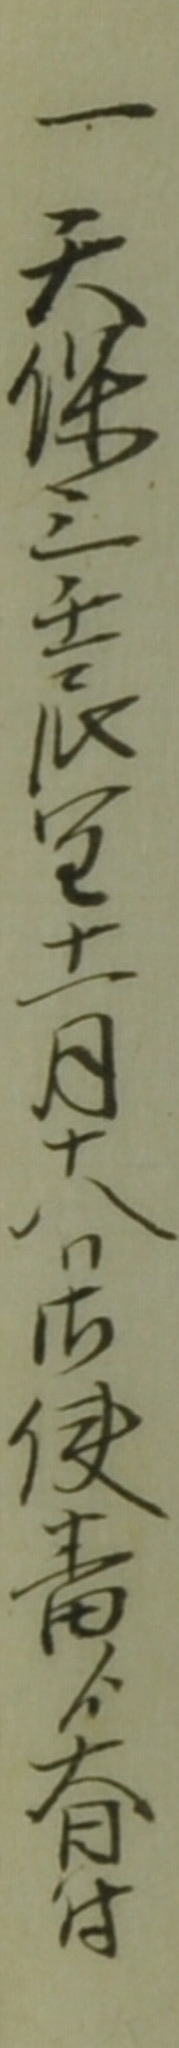一天保三壬辰閏十一月十八日御使番ゟ大目付
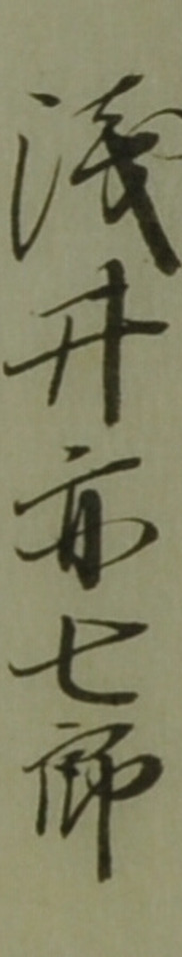浅井亦七郎

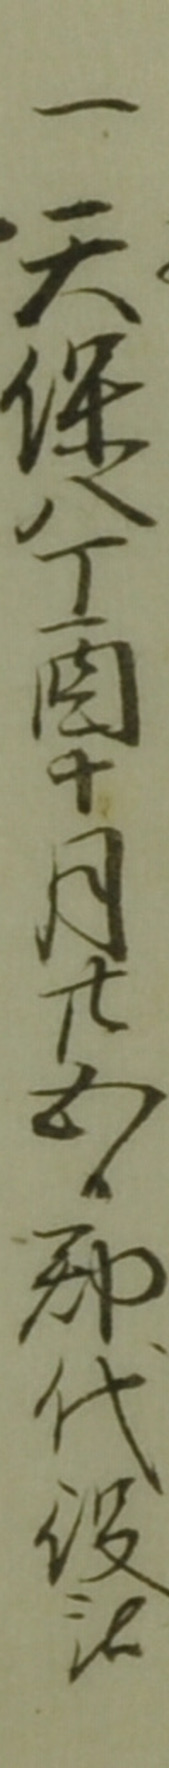一天保八丁酉十月廿五日郡代役被
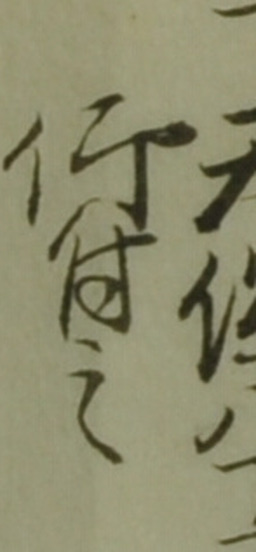仰付之
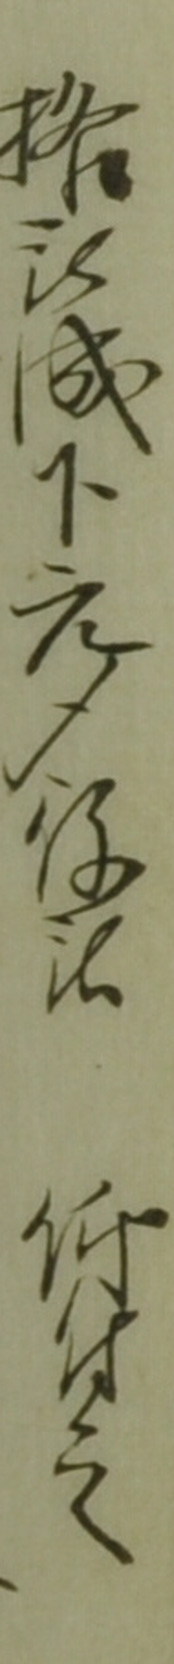格被成下元〆役被仰付之
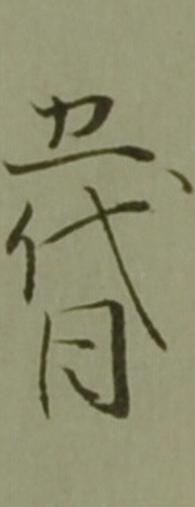五代目
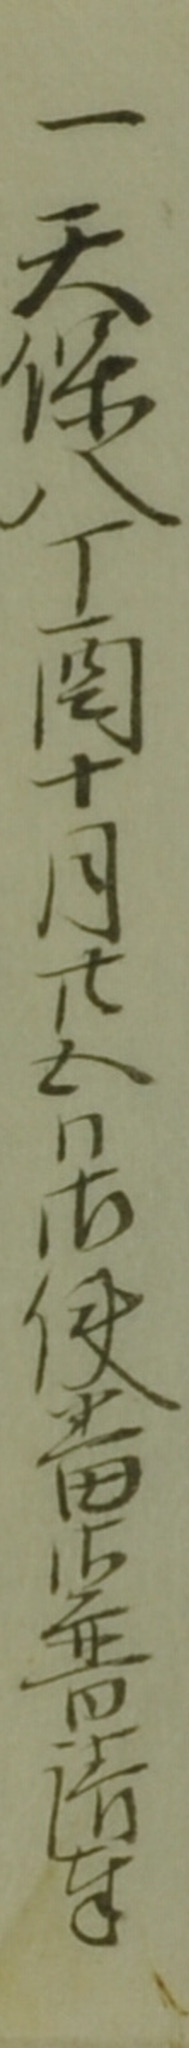一天保八丁酉十月廿五日御使番御普請奉
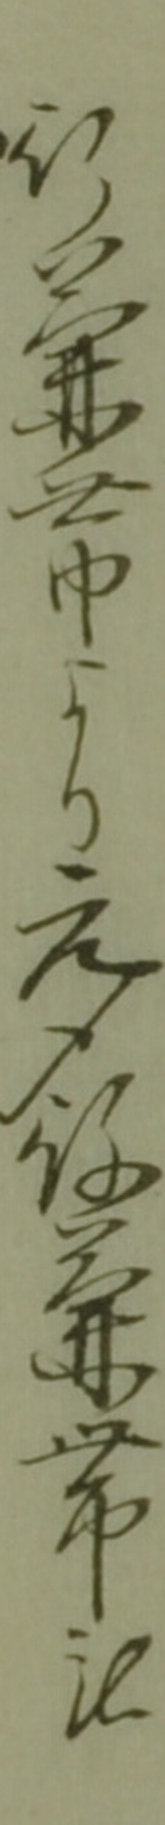行兼帯より元〆役兼帯被
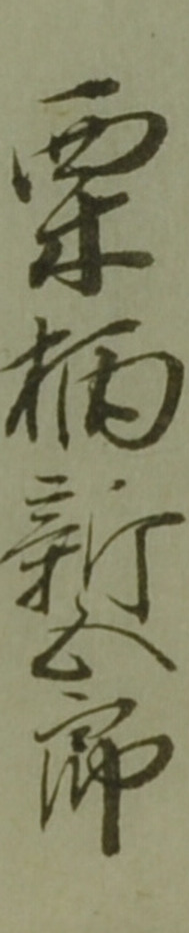栗栖新五郎
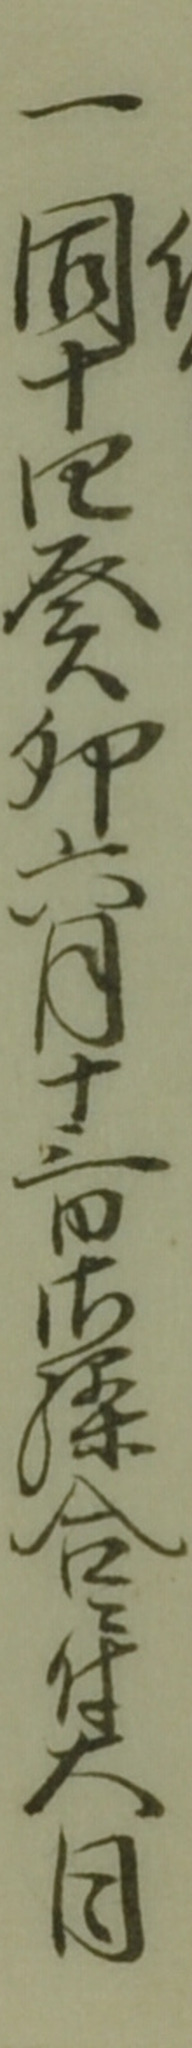一同十四癸卯六月十三日御繰合付大目
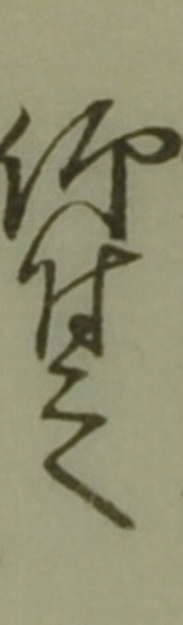仰付之
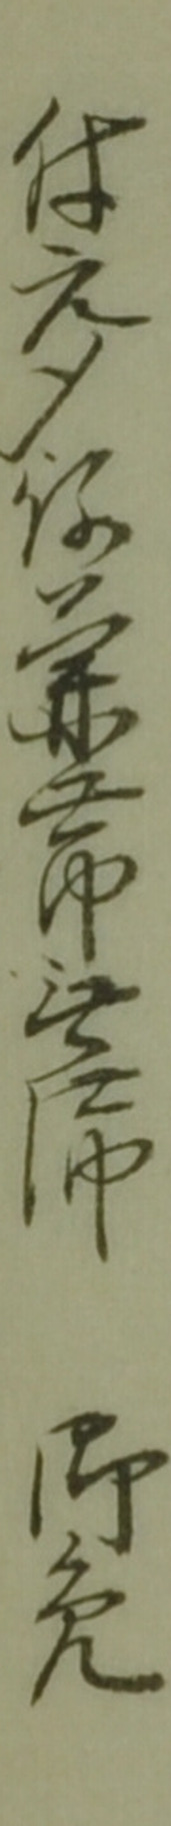付元〆役兼帯無滞御免
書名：諸御役代々録（七）
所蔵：伊那市立高遠町図書館・合同会社AMANE
